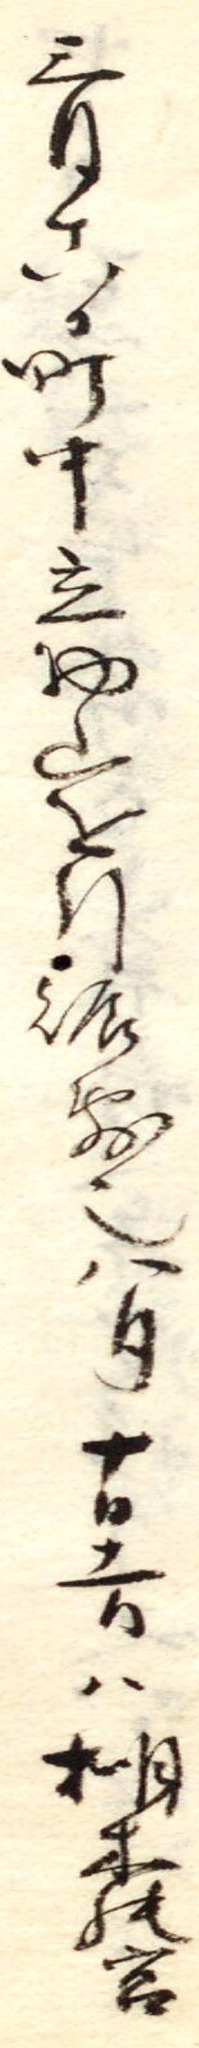三月十八日町中立物山を引賑敷也八月十日十一日は棚木の宮
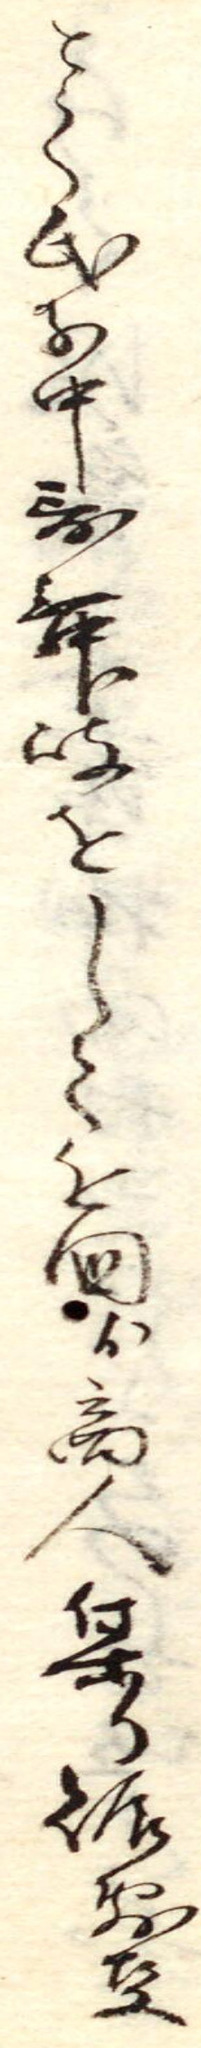とて氏子中哥舞岐をして近国ゟ商人集り賑敷事
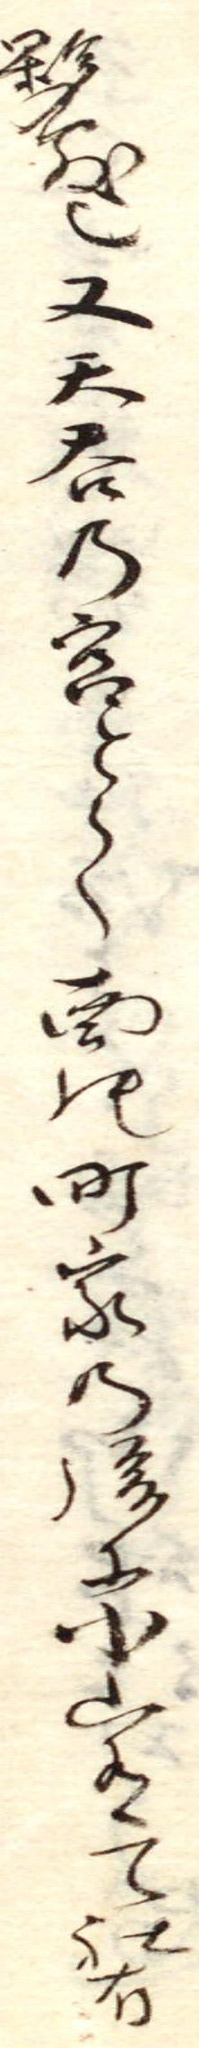夥敷也又天呑の宮とて南の町家の後に小山有て社有
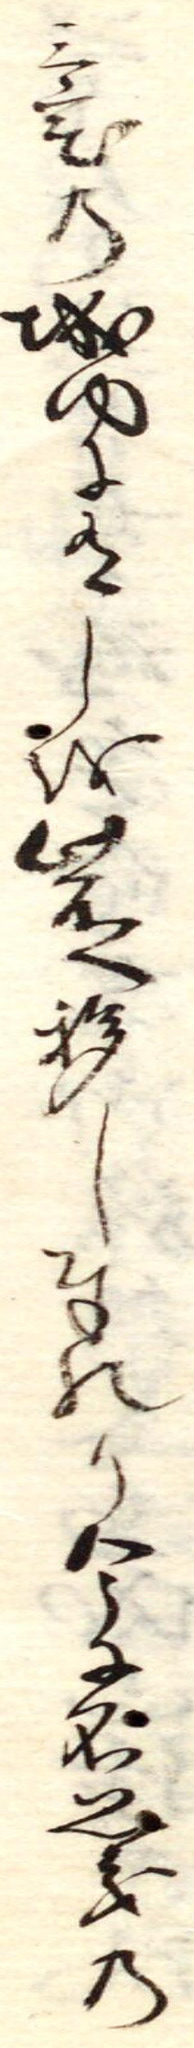三宅の城内に有しを此所へ移し奉れり今に不思義の
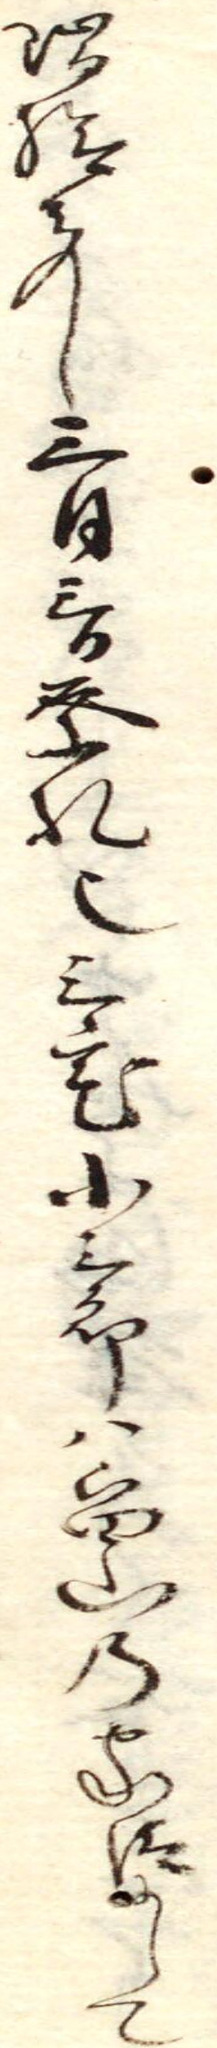瑞給多し三月三日祭礼也三宅小三郎は畠山の家臣にして
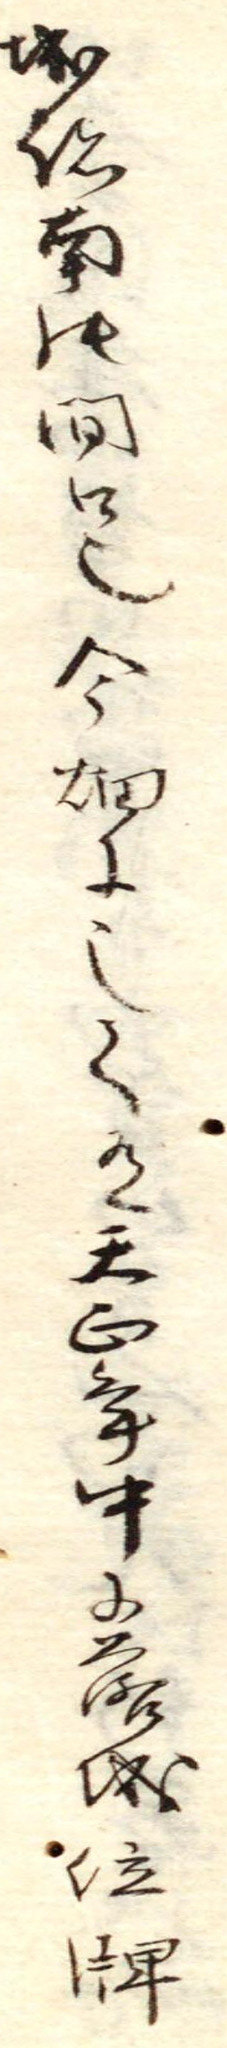城跡南の間口今畑に也て有天正年中に落城位牌
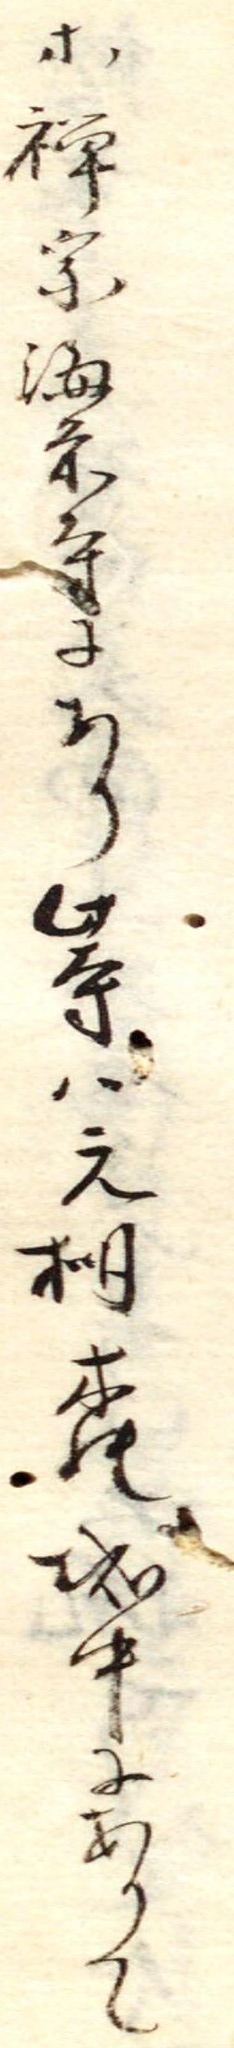等禅宗海前寺にあり此寺は元棚木の城中にありて
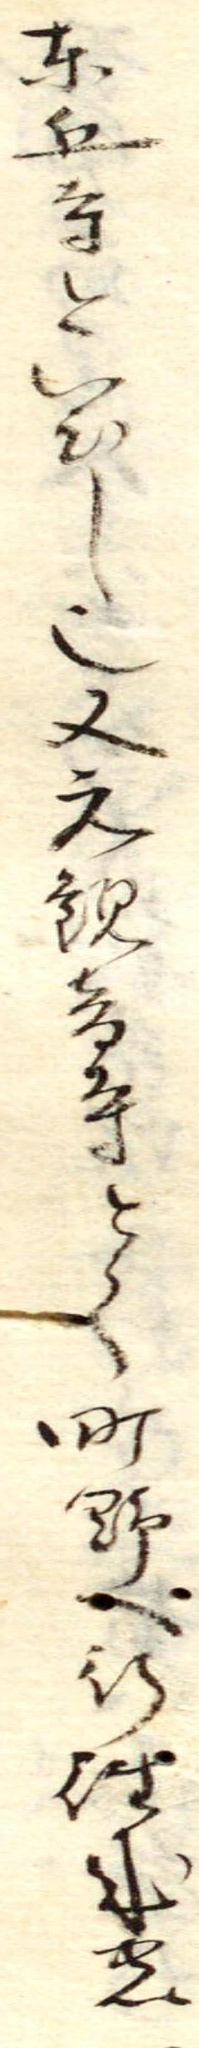東丘寺といひし也又元観音寺とて町野へ行往来の

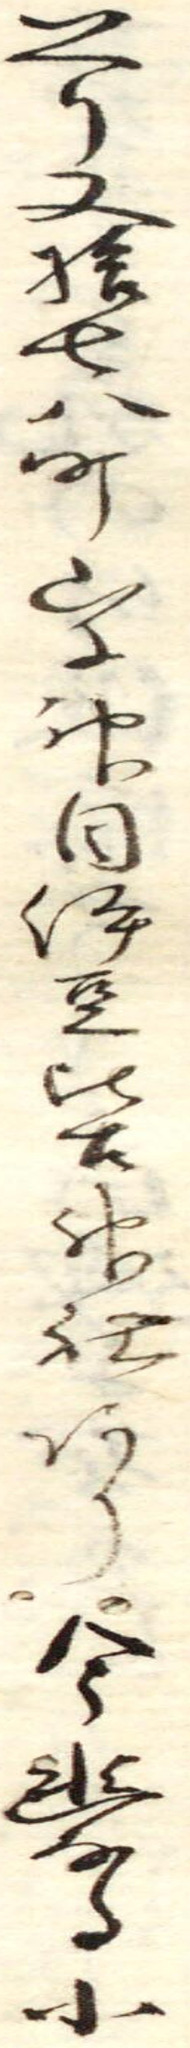いへり又拾七八町山に神目伊豆比古神社あり今幽なる小
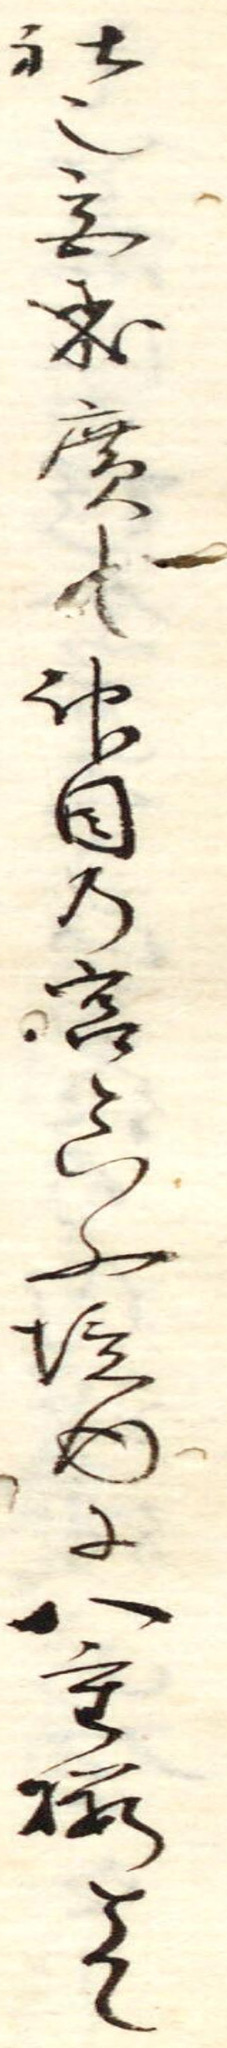社也宮森広し神目の宮といふ境内に八重桜とて
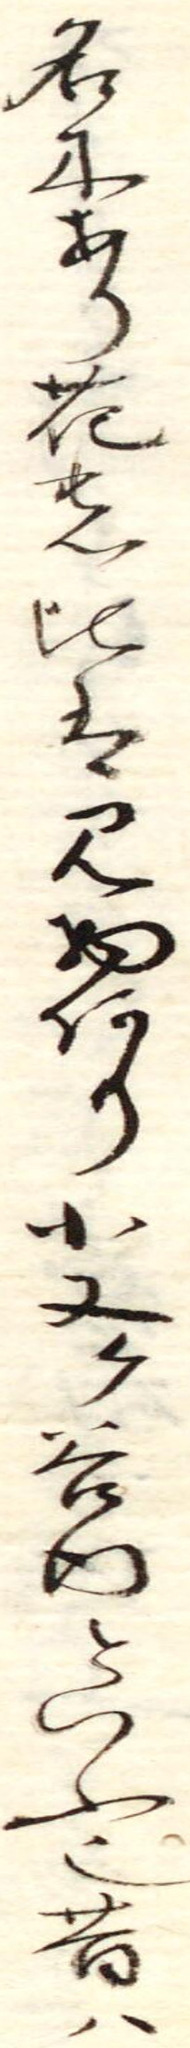名木あり花の比は見物あり小又ヶ谷内といふ也昔は
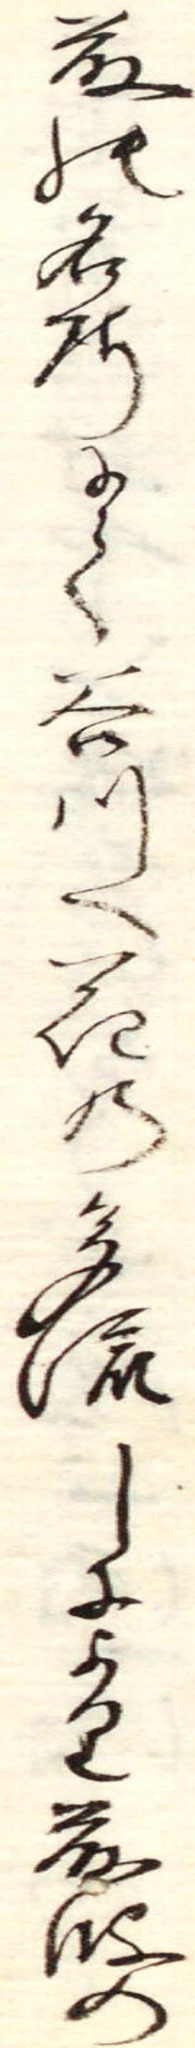藤の名所にて谷川へ花の多流しにより藤波の
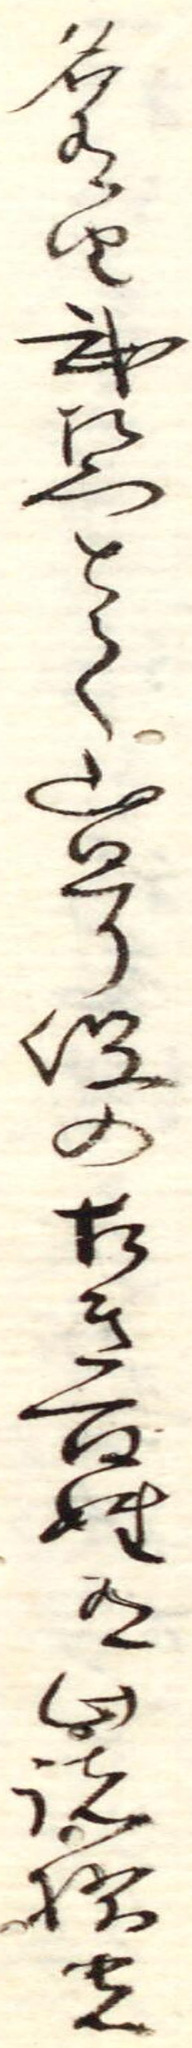名有由武左衛門とて山廻り役の古き百姓有此諸橋の
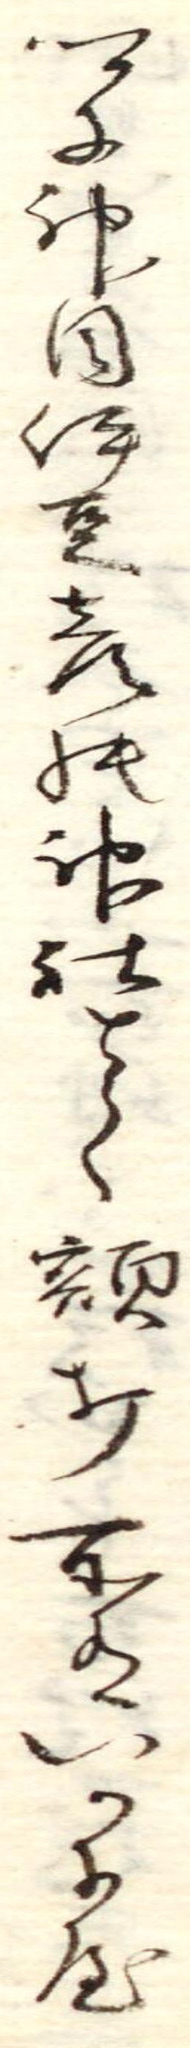郷に神目伊豆彦の神社とて額打所有いかにや
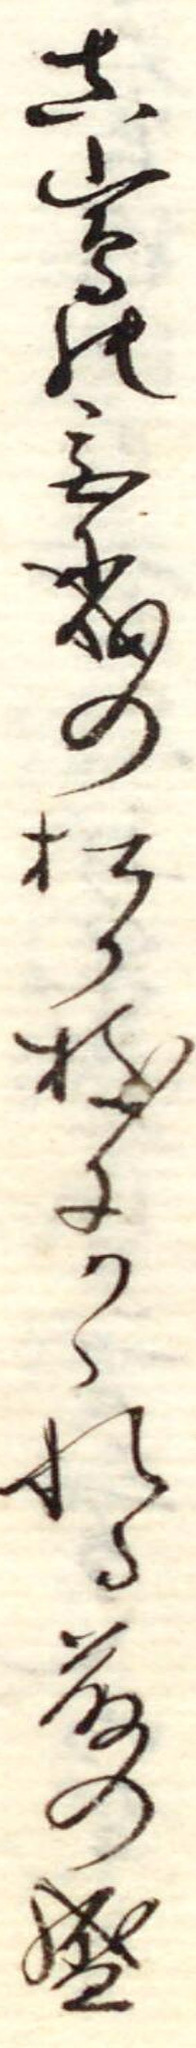真嶋の宮森松か枝にかゝれる藤の盛
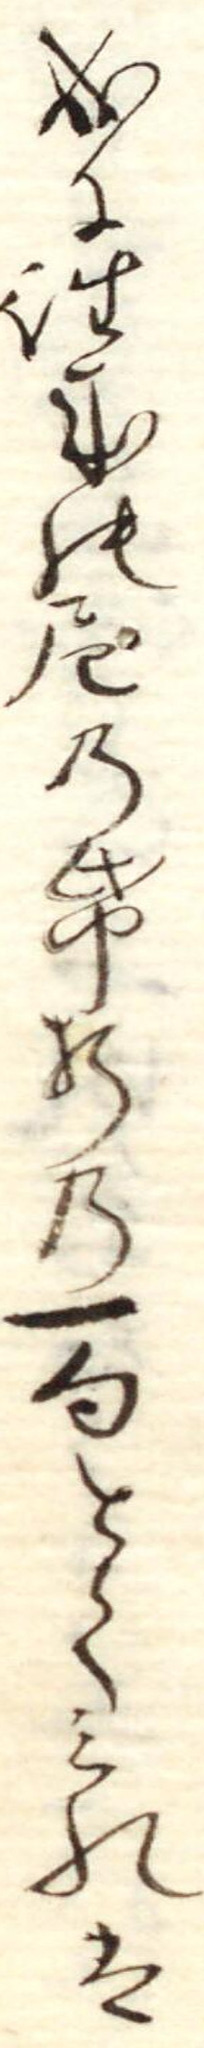成に往来の尼の帋折の一句とてみれは
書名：能登名跡誌
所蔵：Ishikawa Prefectural Library
